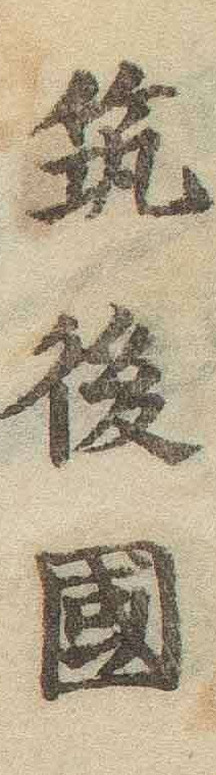筑後国

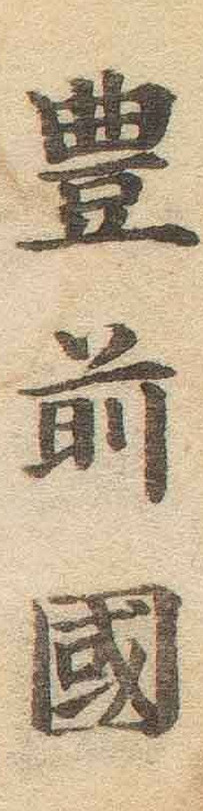豊前国
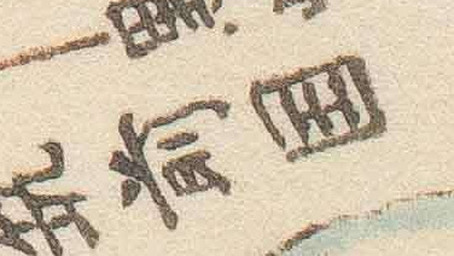豊前国
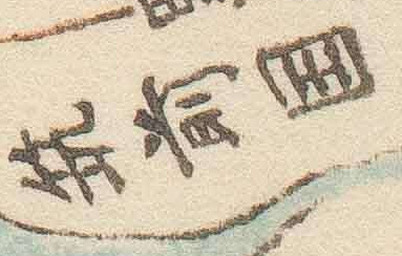豊前国

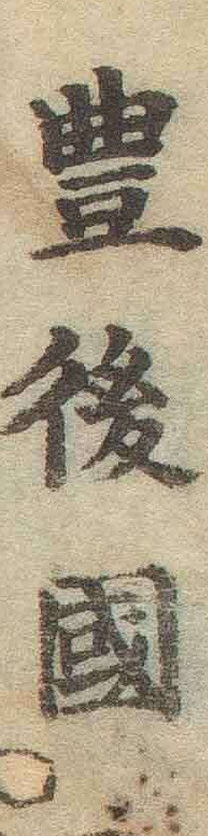豊後国
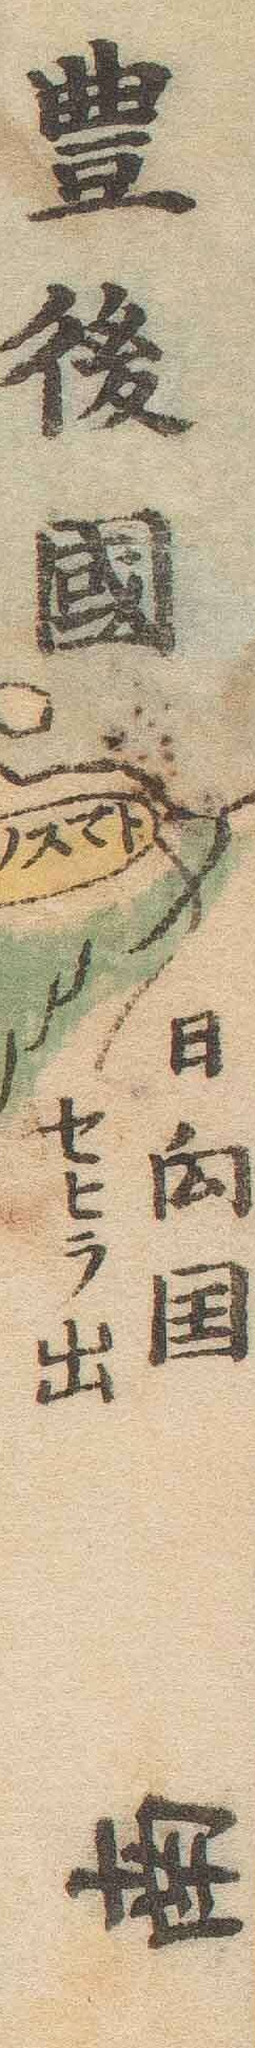豊後国
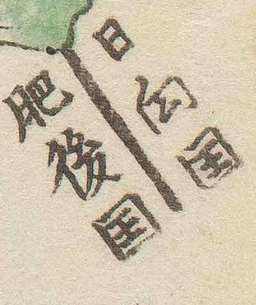豊後国
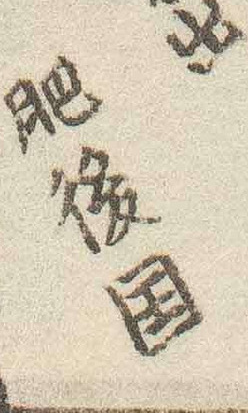豊後国
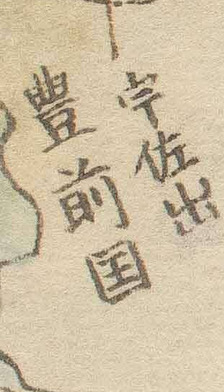豊後国
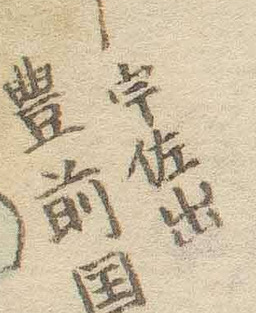豊後国

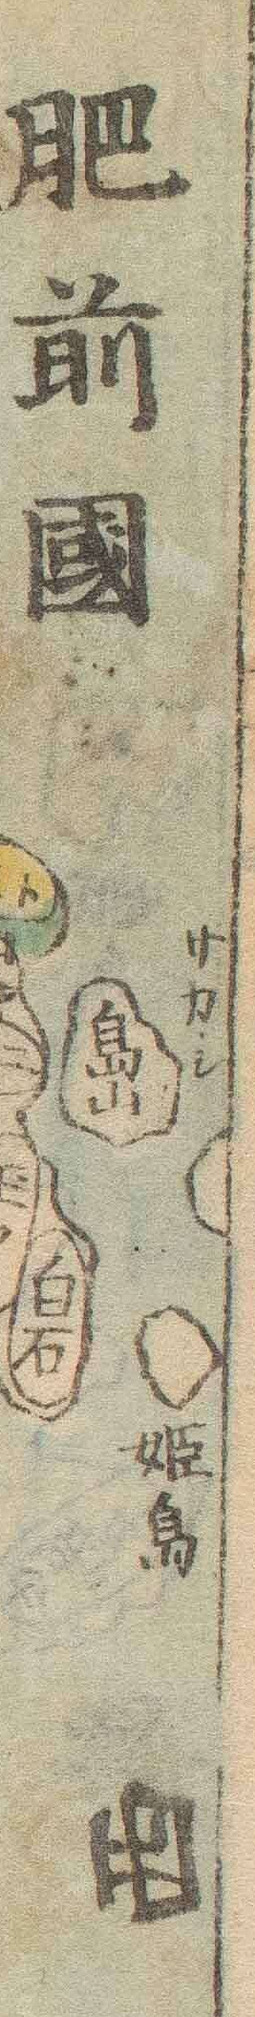肥前国
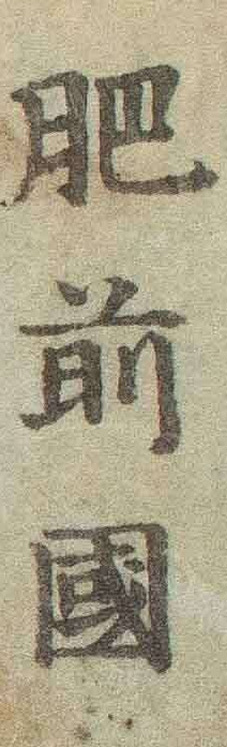肥前国

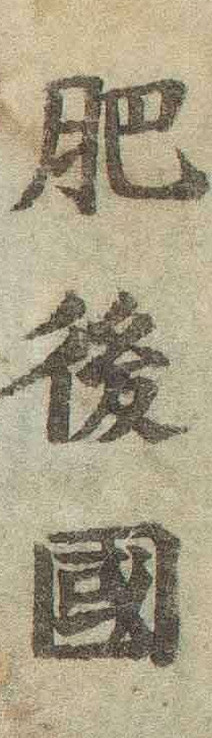肥後国
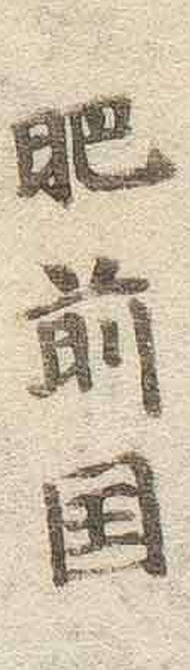肥後国

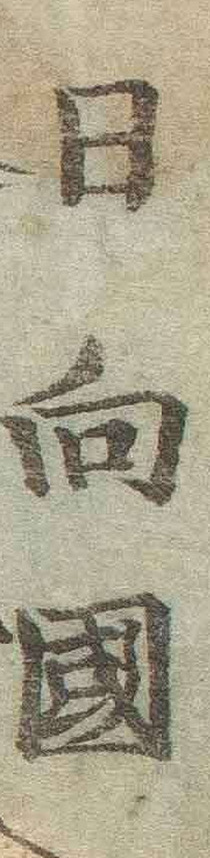日向国

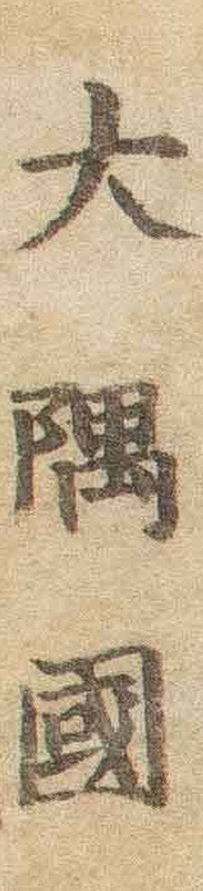大隅国
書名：国郡全図
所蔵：東京学芸大学附属図書館 国文学研究資料館
